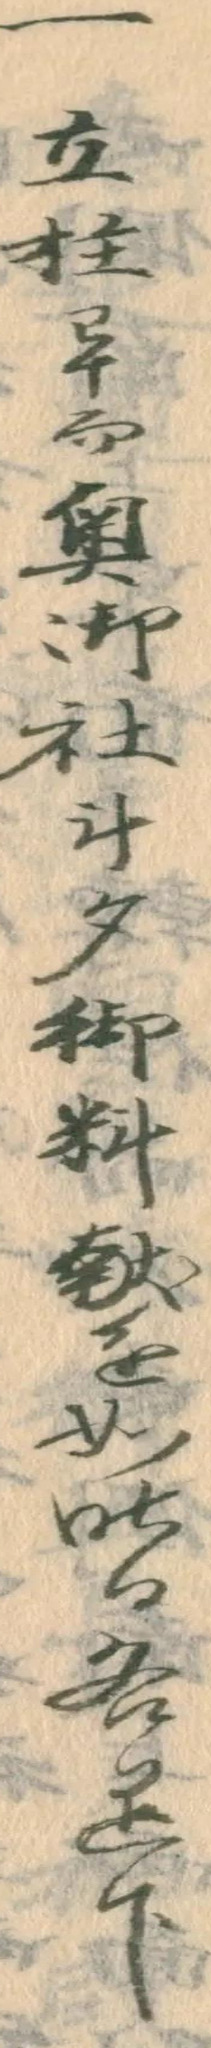一立柱畢而奥御社計夕御料献進如昨日各退下
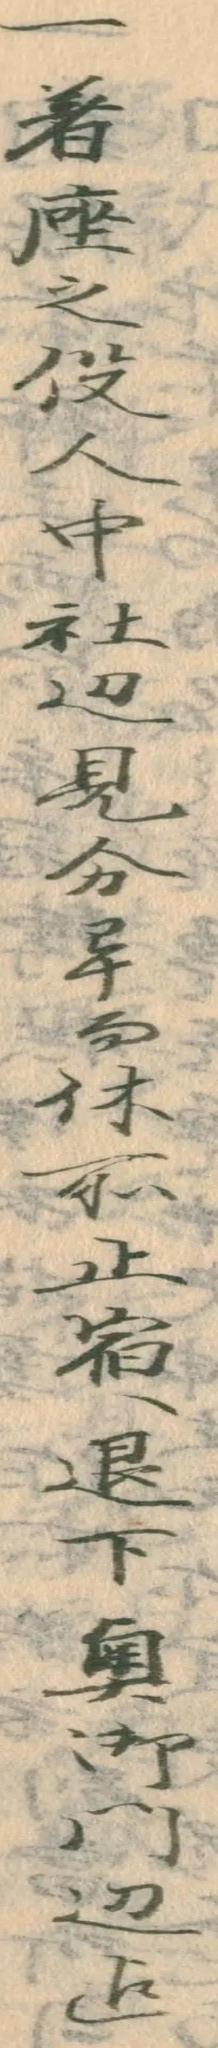一着座之役人中社辺見分畢而休所止宿へ退下奥御門辺迄
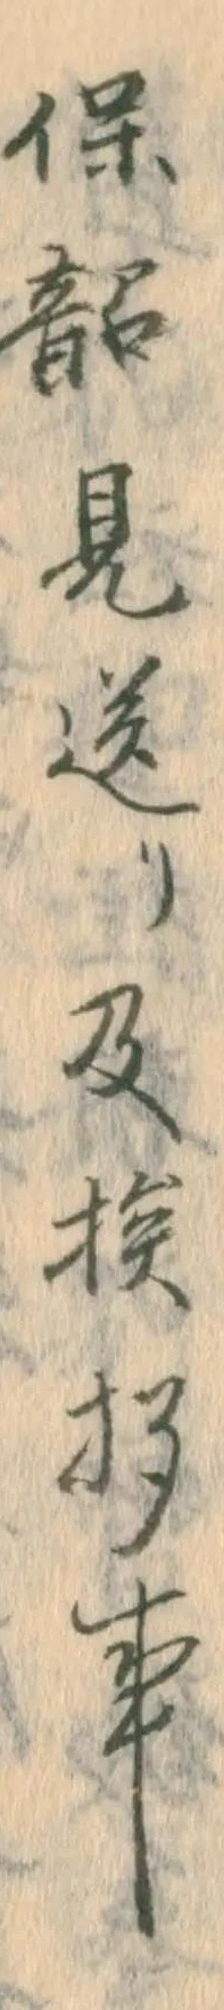保韶見送リ及挨拶事
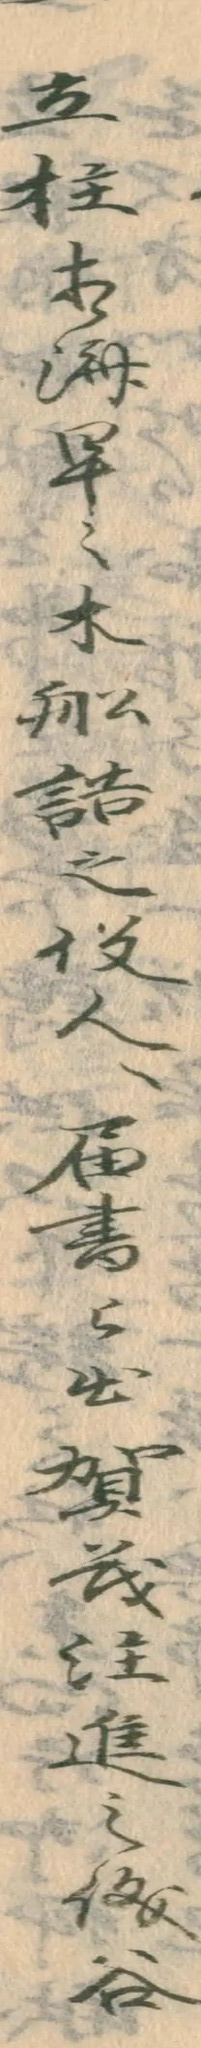一立柱相済早々木船詰之役人へ届書被出賀茂注進之儀谷
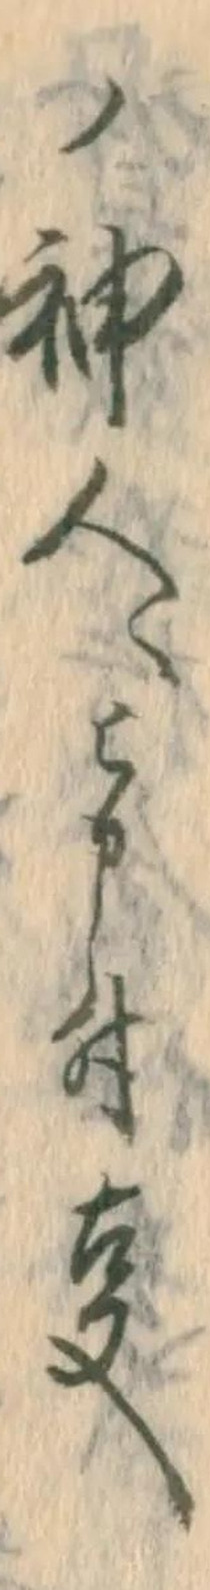ノ神人へ被申付事
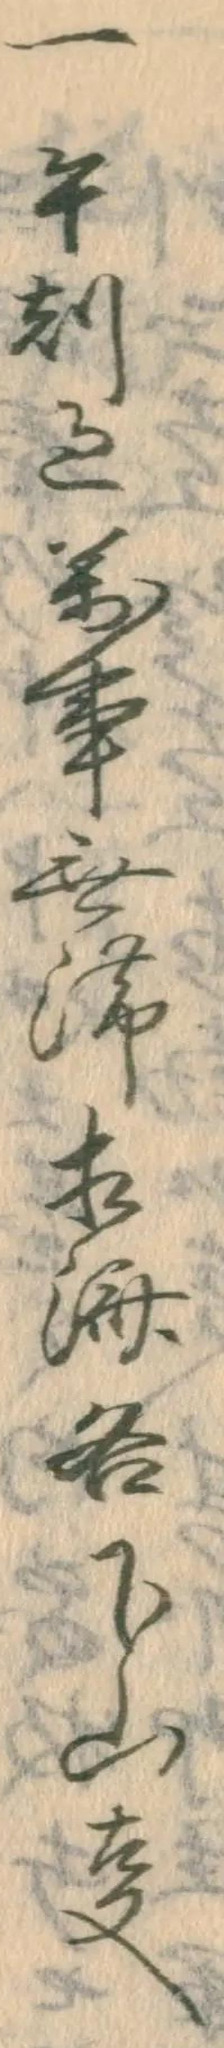一午刻過万事無滞相済各下山事
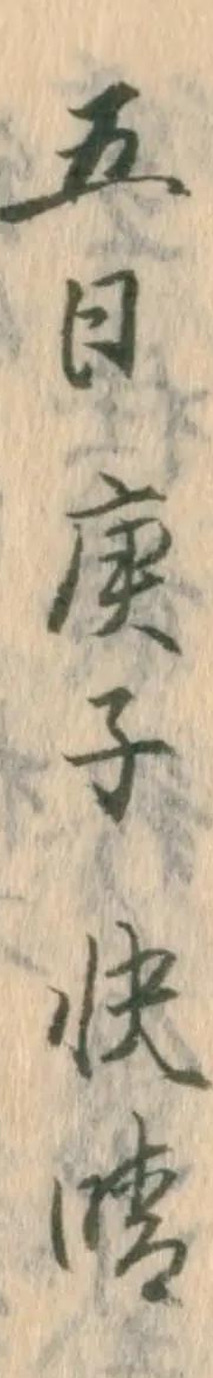五日庚子快晴
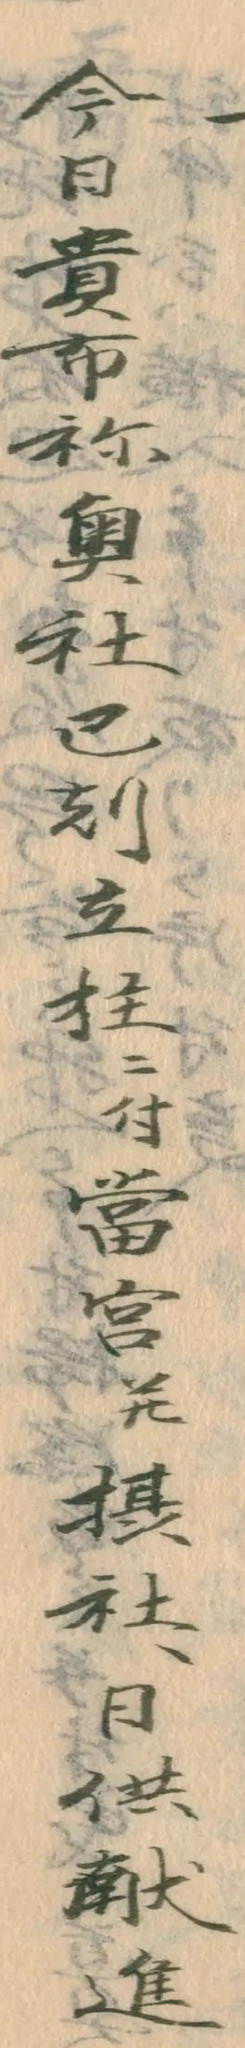一今日貴布祢奥社巳刻立柱ニ付当宮并摂社へ日供献進
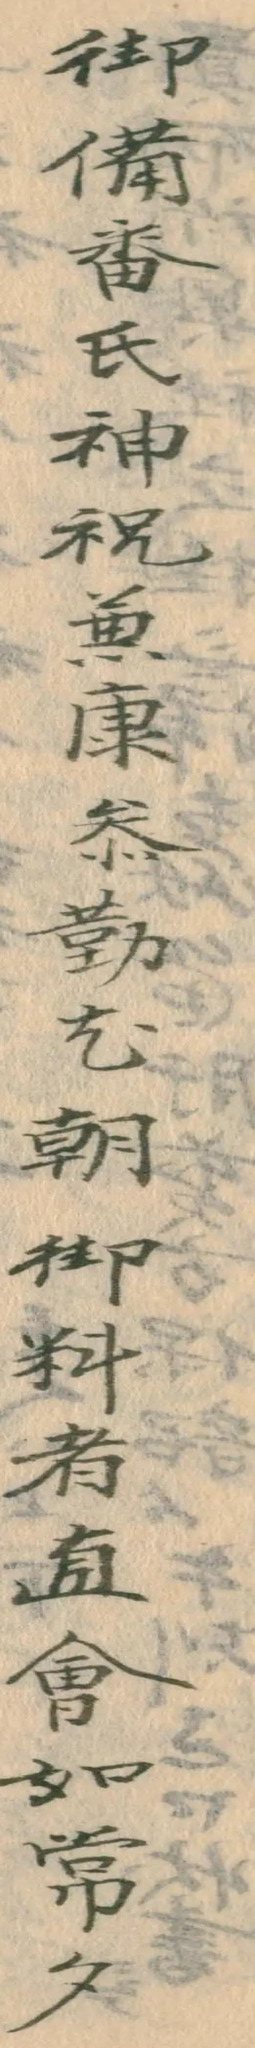御備番氏神祝兼康参勤尤朝御料者直会如常夕
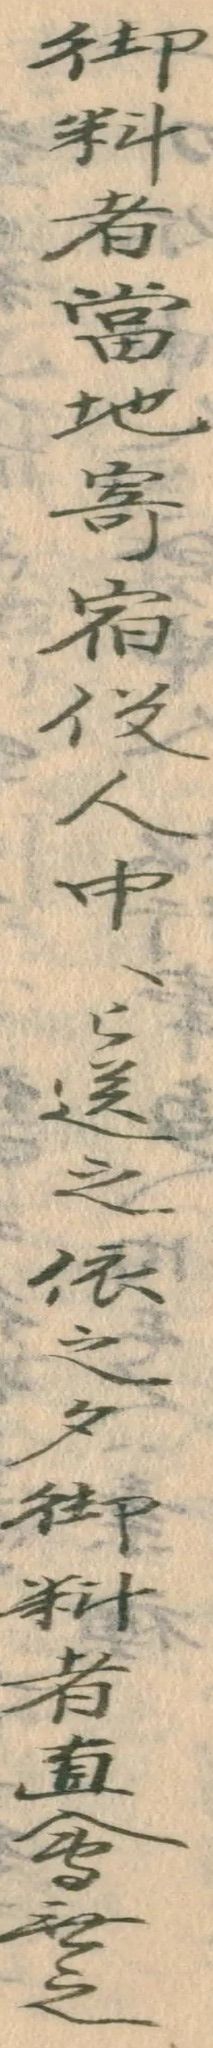御料者当地寄宿役人中へ被送之依之夕御料者直会無之
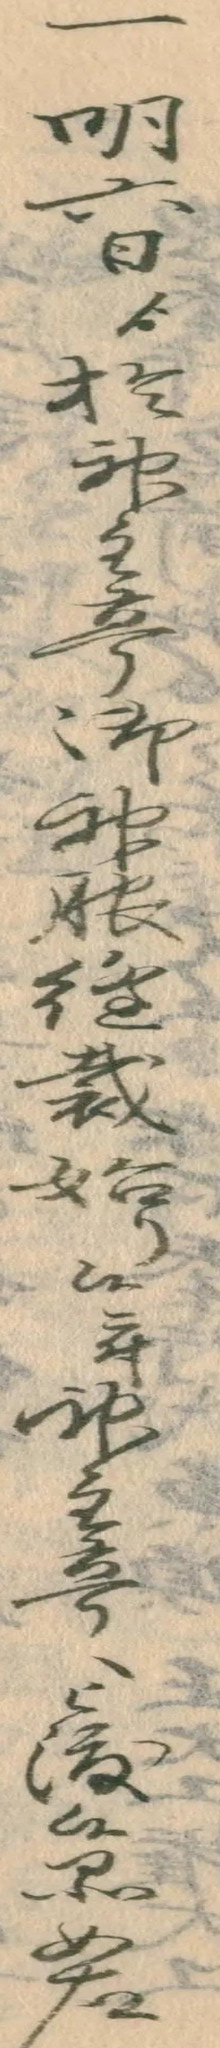一明六日ゟ於神主亭御神服縫裁始り候ニ付神主亭へ被渡候品如左
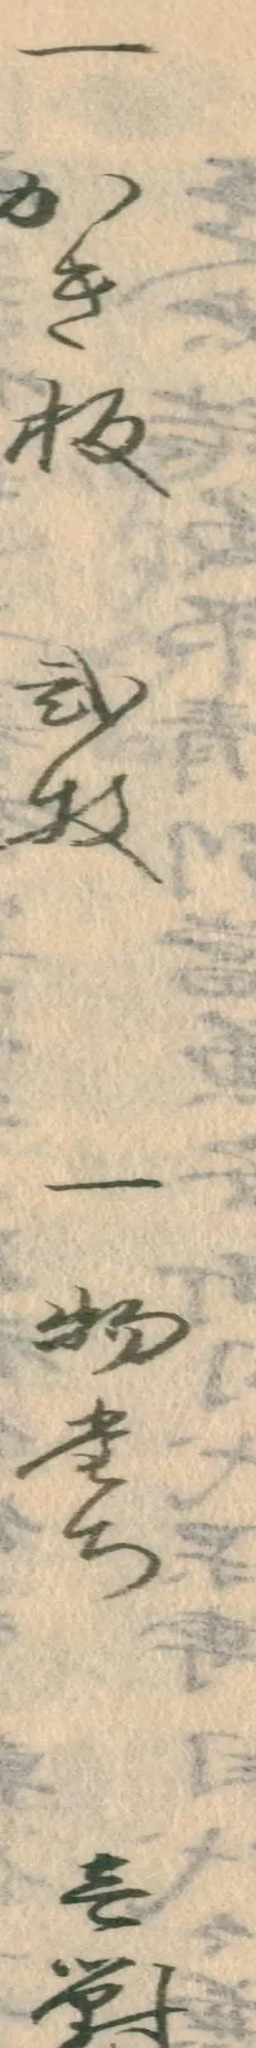一かき板弐枚一物たち壱対
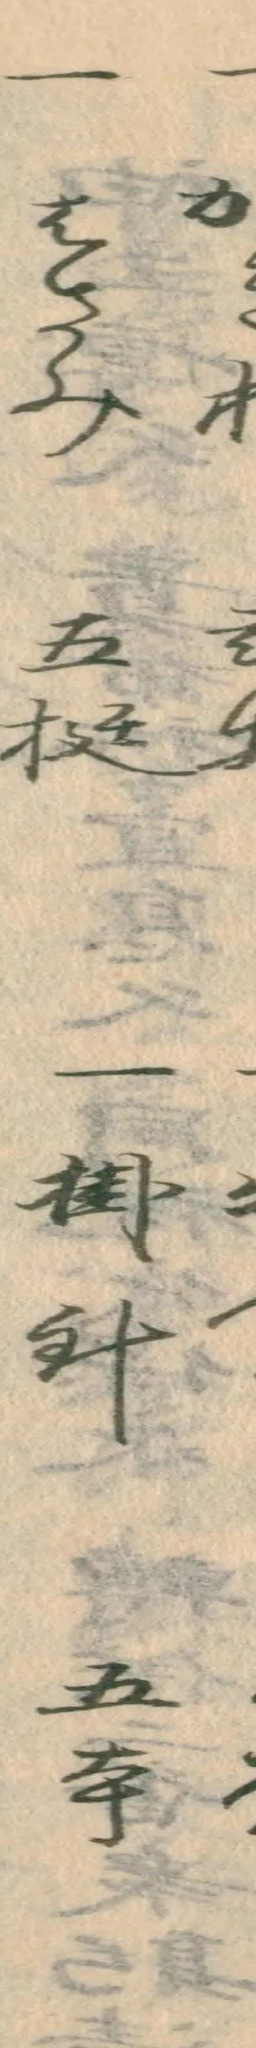一はさみ五挺一掛針五本
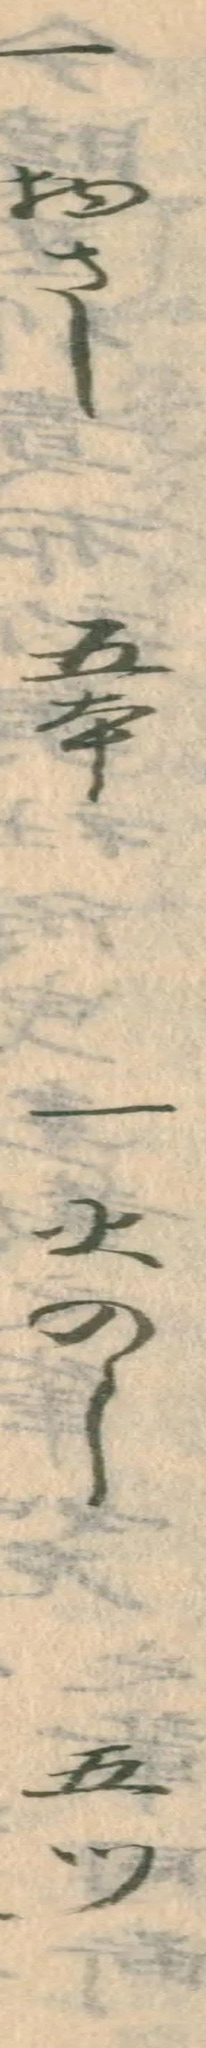一物さし五本一火のし五ツ
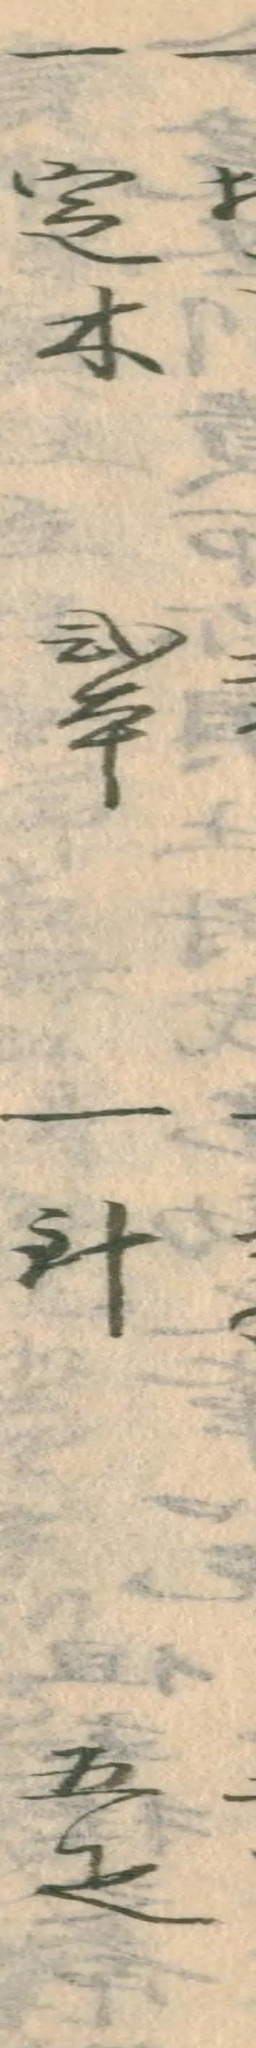一定木弐本一針五疋
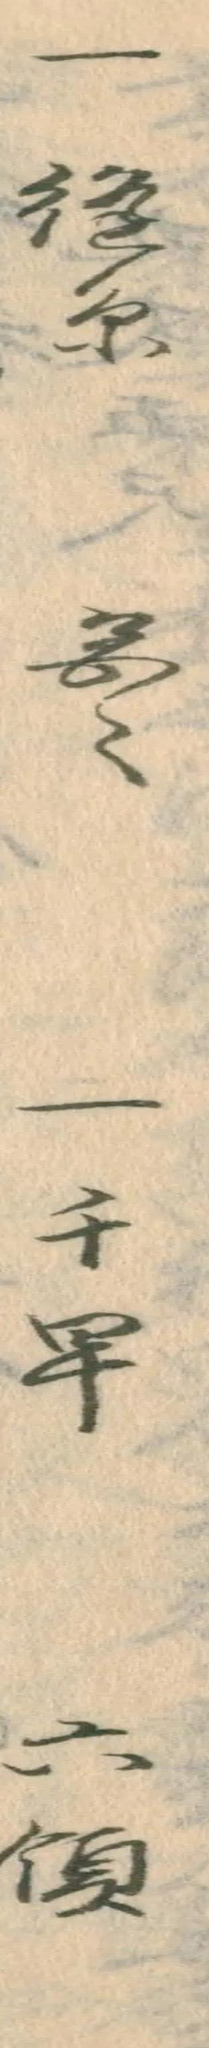一縫糸色々一千早六領
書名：賀茂社記録. 第17冊
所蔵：国立国会図書館 National Diet Library, JAPAN
